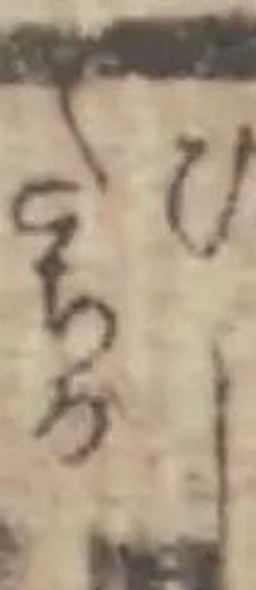たちが
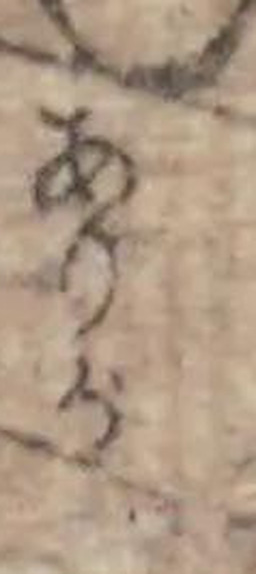ありが
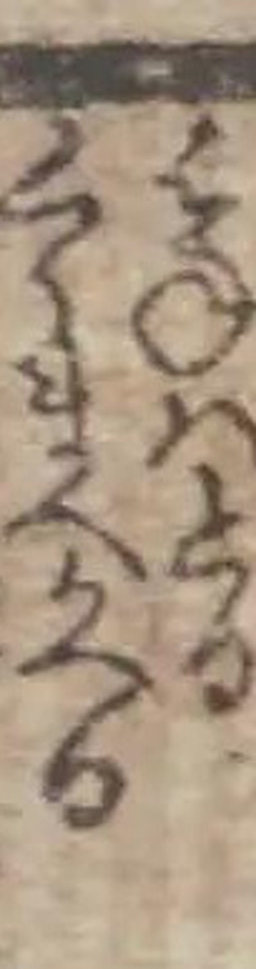くらまへかへる
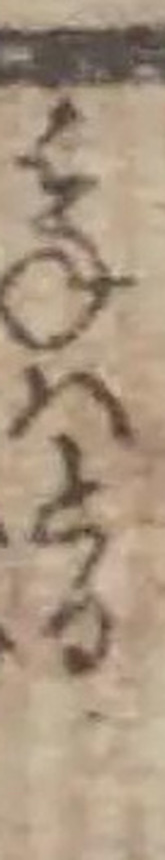はねハとる
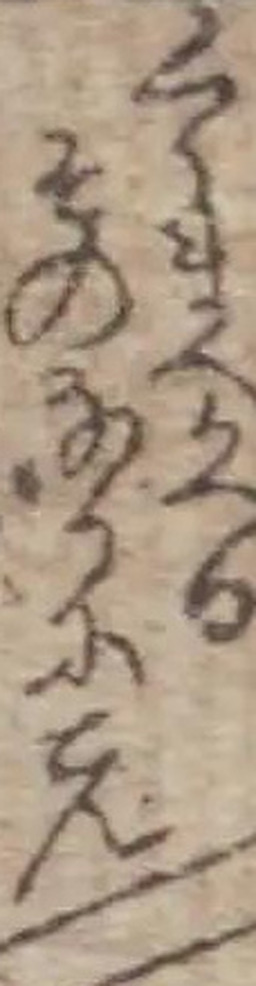そのなかにてん

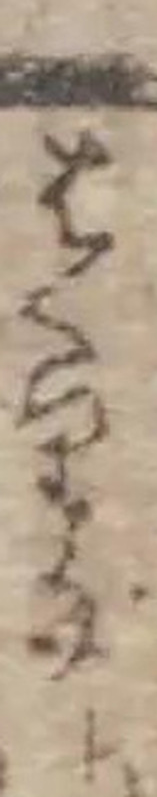はくりう
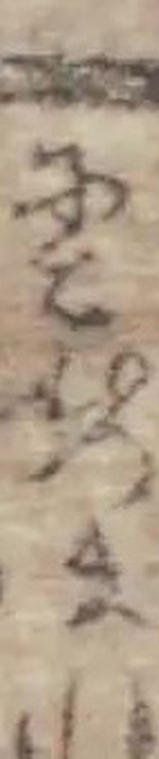にてむつま
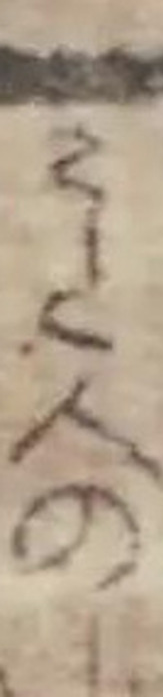こと人の
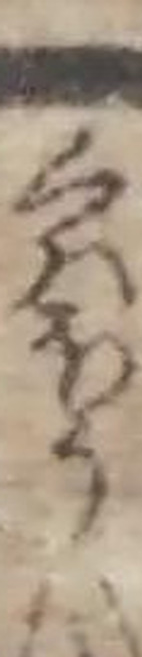くハほう
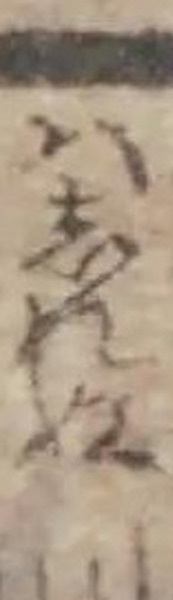ハしれぬ
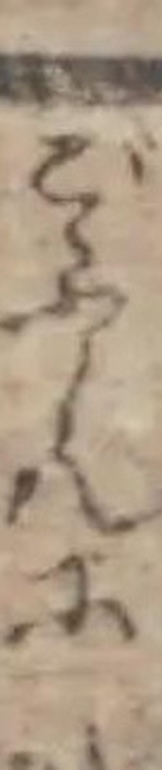ごふしんに
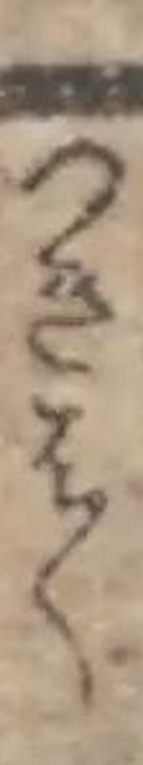つきはく
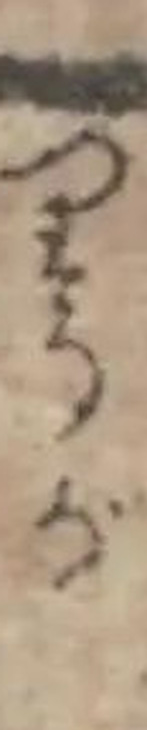りうが
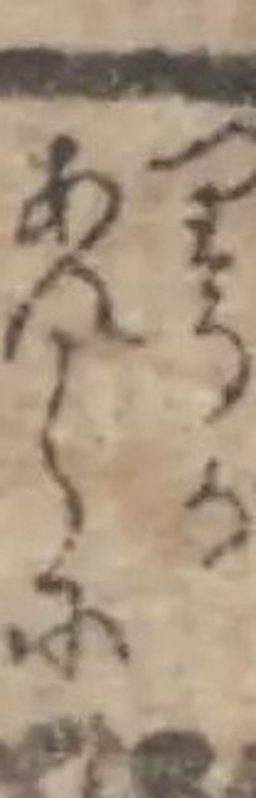あんしに
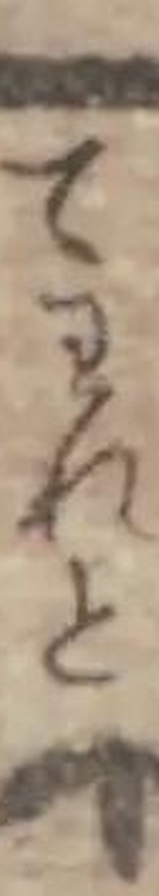てわれと
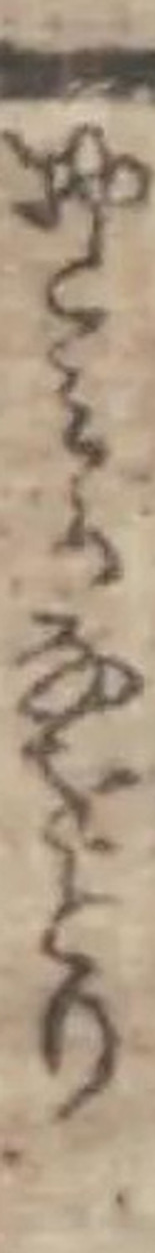おとミかなをとり
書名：草紙の曙 3巻
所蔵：国立国会図書館 National Diet Library, JAPAN
